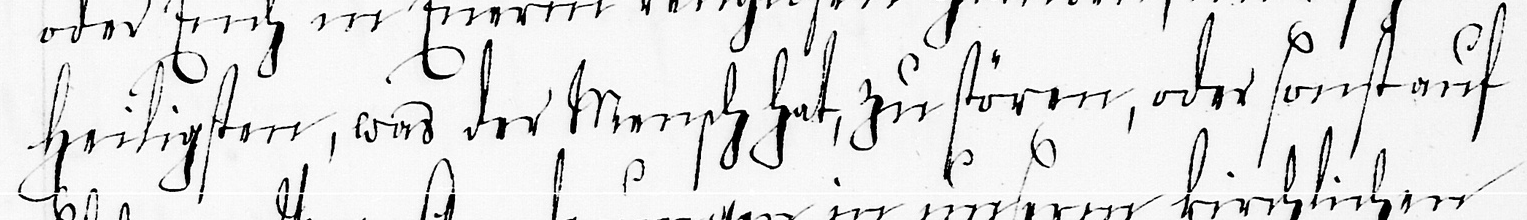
Heiligsten, was der Mensch hat, zu stören, oder sonst auf
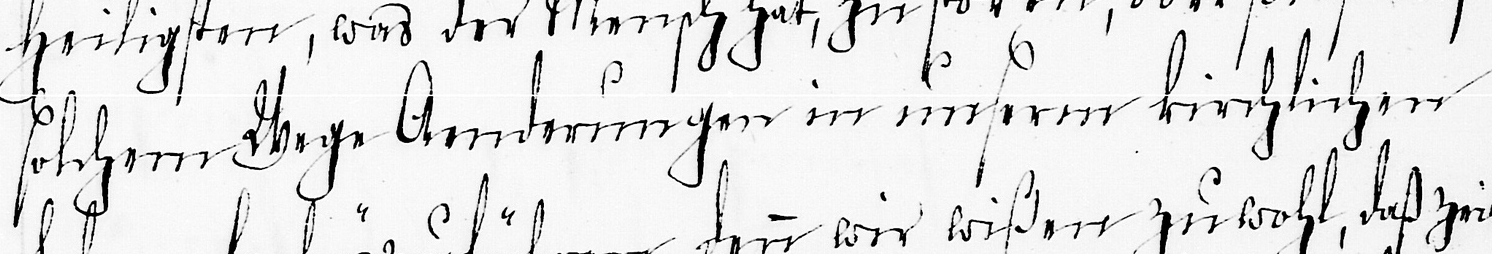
solchem Wege Aenderungen in unserm kirchlichen
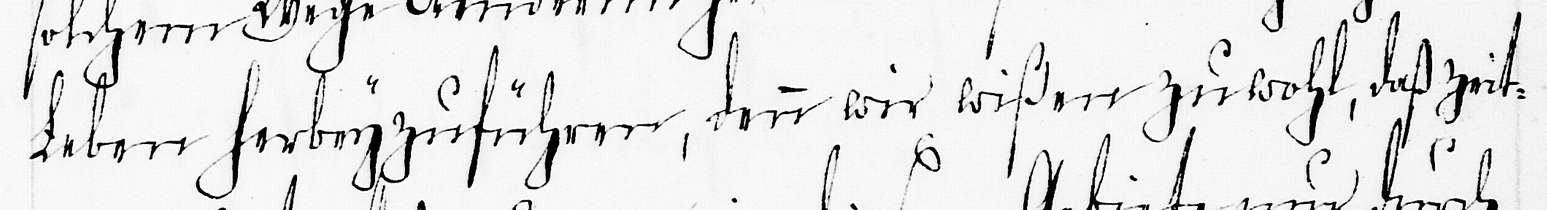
Leben herbeyzuführen, denn wir wißen zu wohl, daß zeit¬
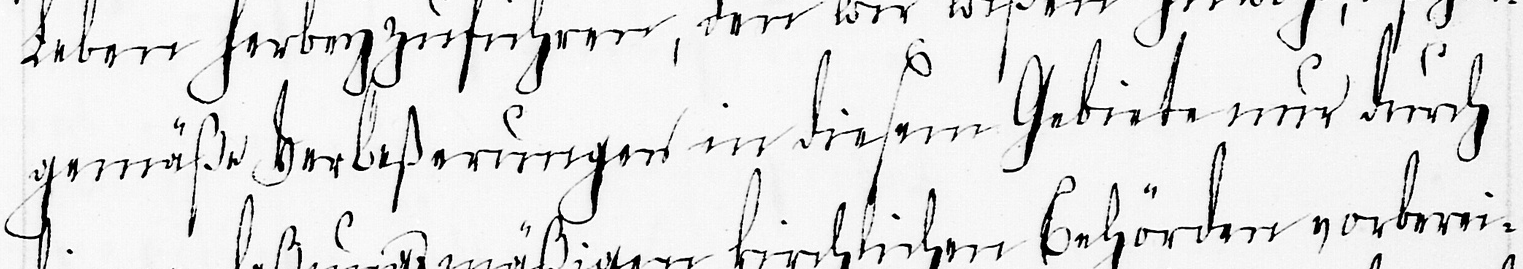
gemäße Verbeßerungen in diesem Gebiete nur durch
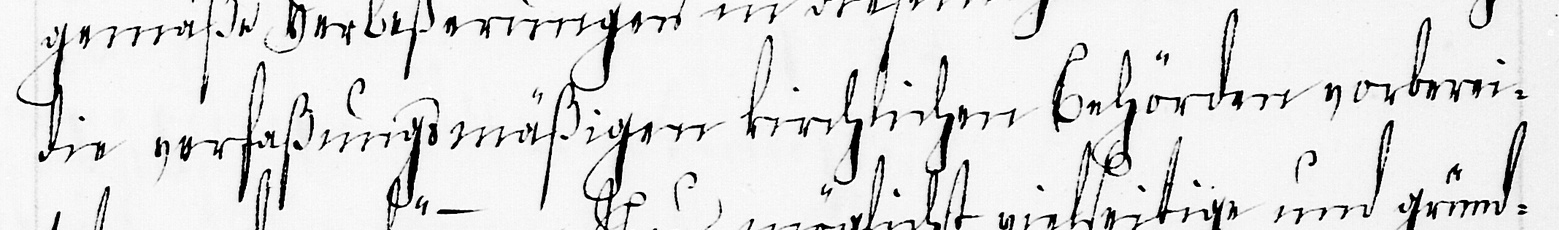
die verfaßungsmäßigen kirchlichen Behörden vorberei¬
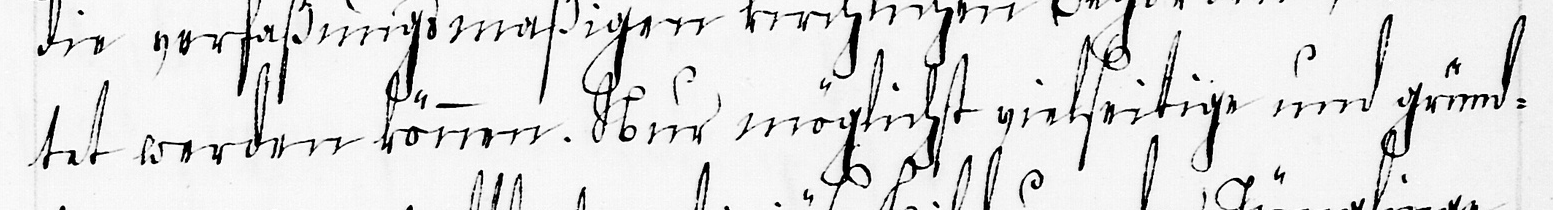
tet werden können. Nur möglichst vielseitige und gründ¬
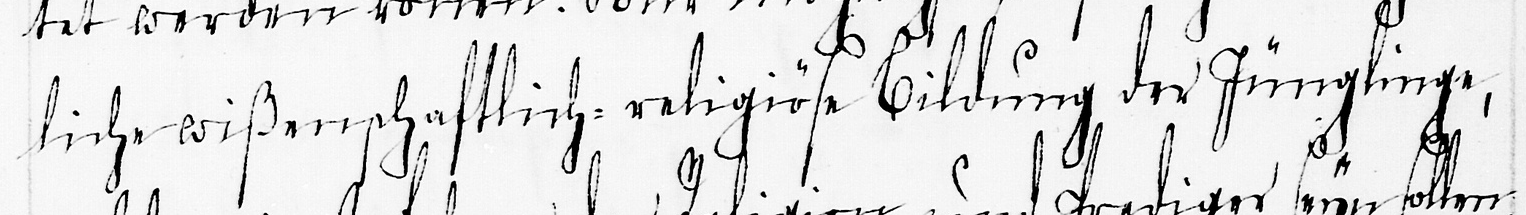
liche wißenschaftlich-religiöse Bildung der Jünglinge,
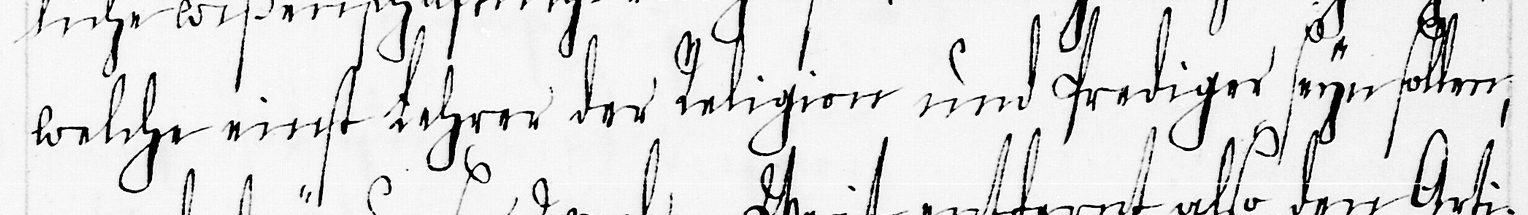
welche einst Lehrer der Religion und Prediger seyn sollen,
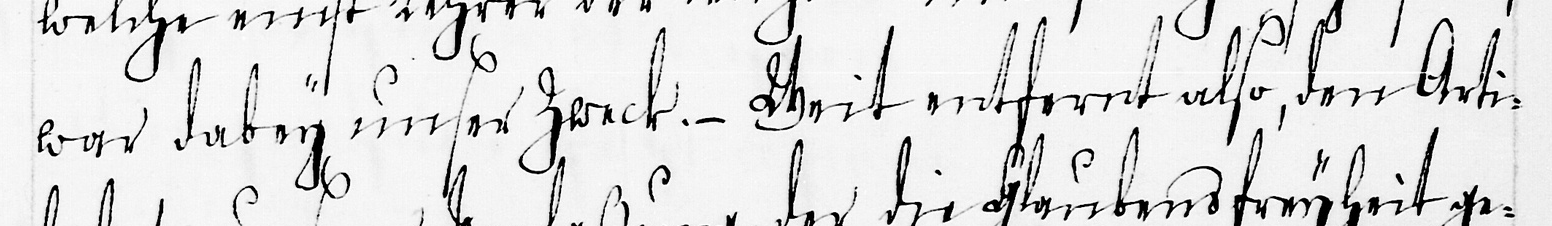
war dabey unser Zweck. – Weit entfernt also, den Arti¬
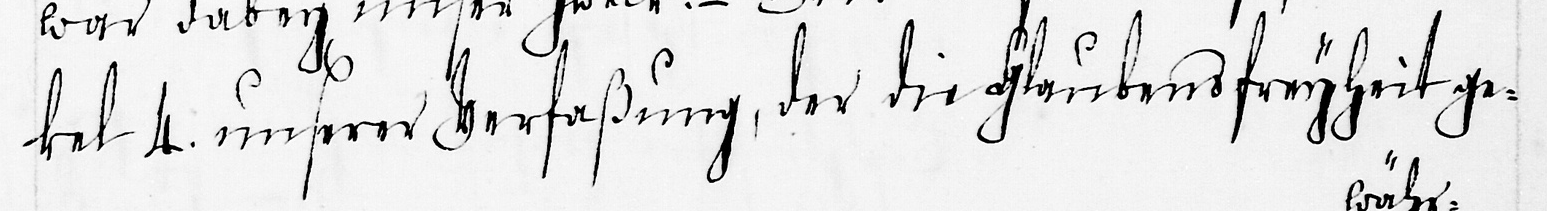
kel 4. unserer Verfaßung, der die Glaubensfreyheit ge-
